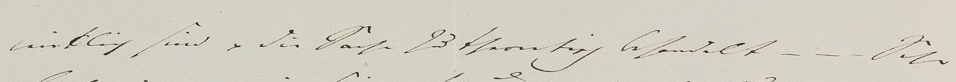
wirklich sind & die Sache zu theoretisch behandelt –– Sehr
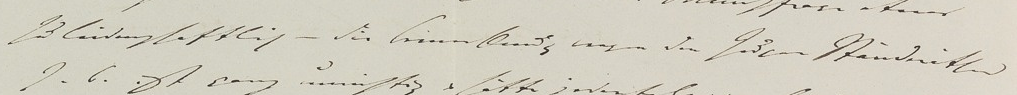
zu leidenschaftlich – die Bemerkung wegen den Zuger Ständeräthen
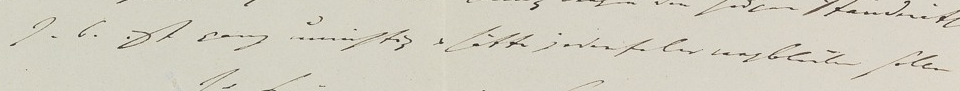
z. b. ist ganz unrichtig & hätte jedenfalls wegbleiben sollen -
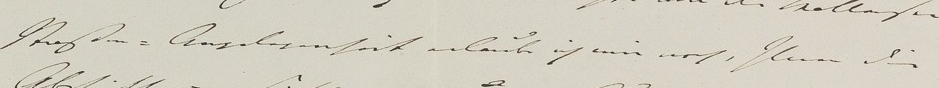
Straßen-Angelegenheit erlaube ich mir noch, Ihnen die
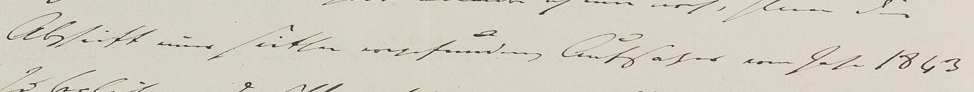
Abschrift eines seither vorgefundenen Aufsatzes vom Jahre 1843
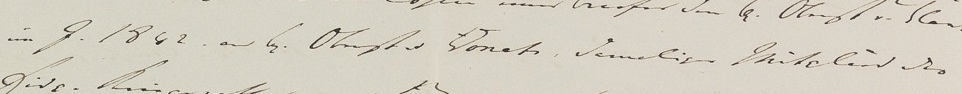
im J. 1842 an H. Oberst v. Donati, damaliges Mitglied des
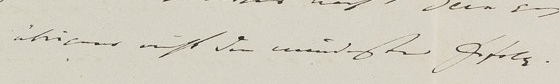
übrigens nicht den mindesten Erfolg.
